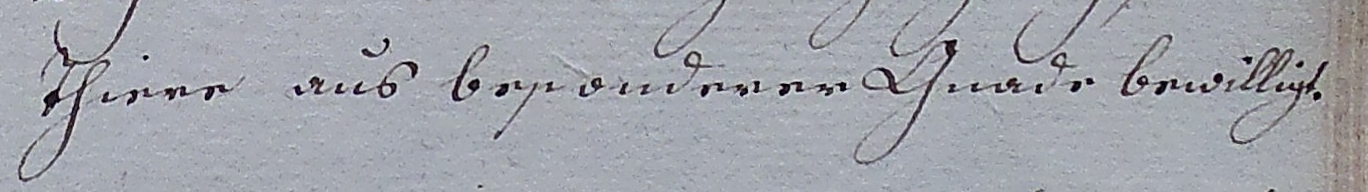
Thiere aus besonderer Gnade bewilligt.
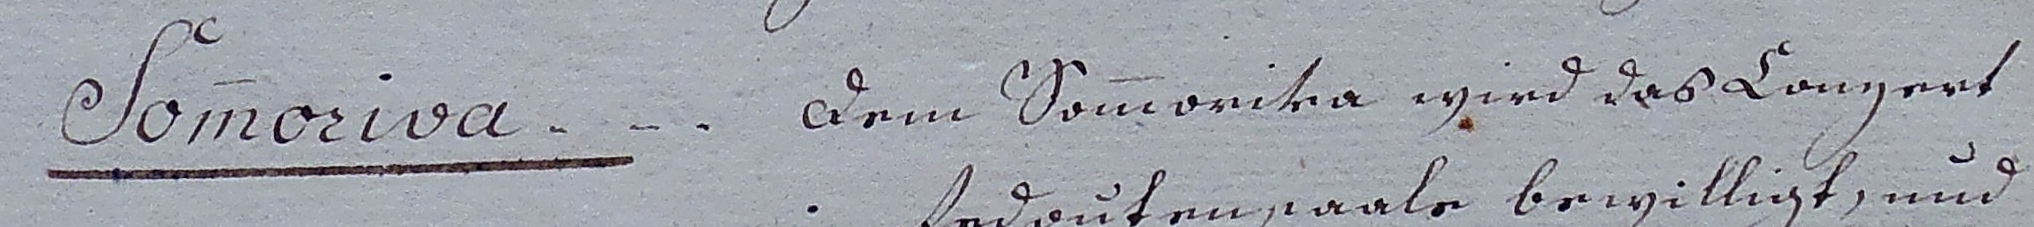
Som̅oriva .. .. . Dem Som̅oriva wird das Conzert
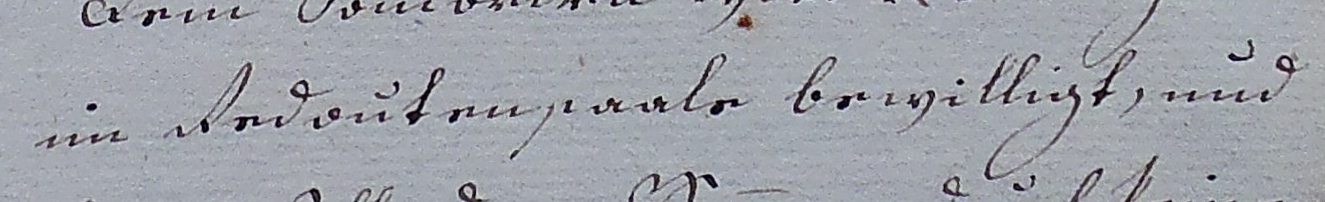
im Redoutensaale bewilligt, und
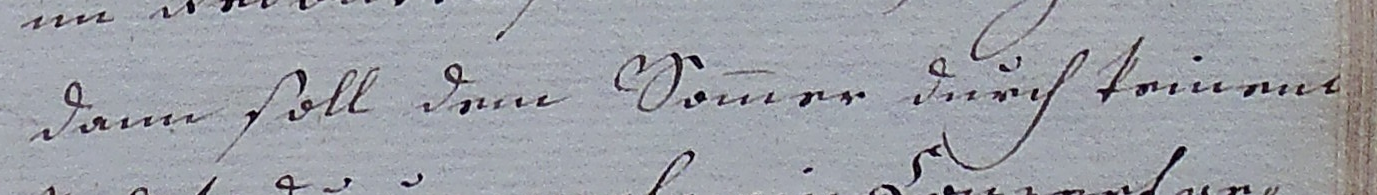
dann soll dem Som̅er durch keinem
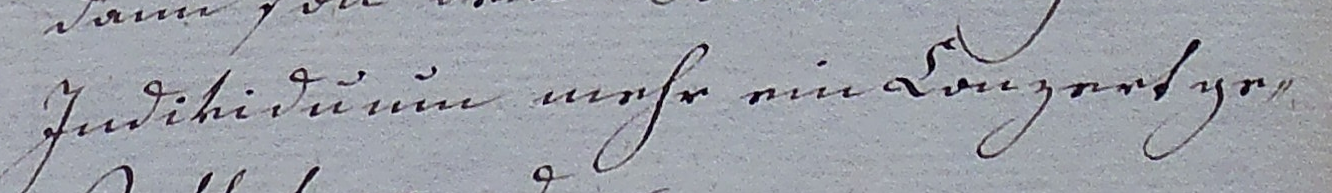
Individuum mehr ein Conzert ge¬
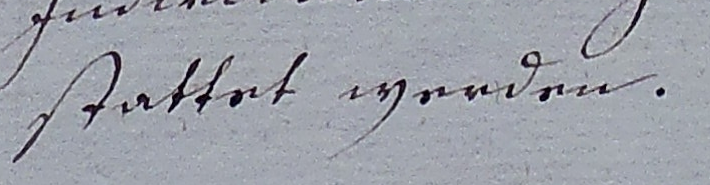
stattet werden.
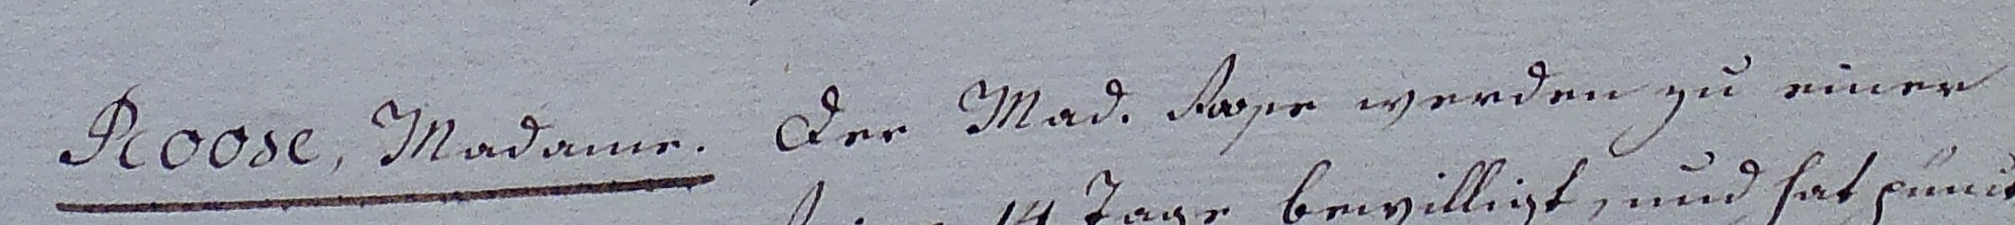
Roose, Madame. Der Mad. Roose werden zu einer
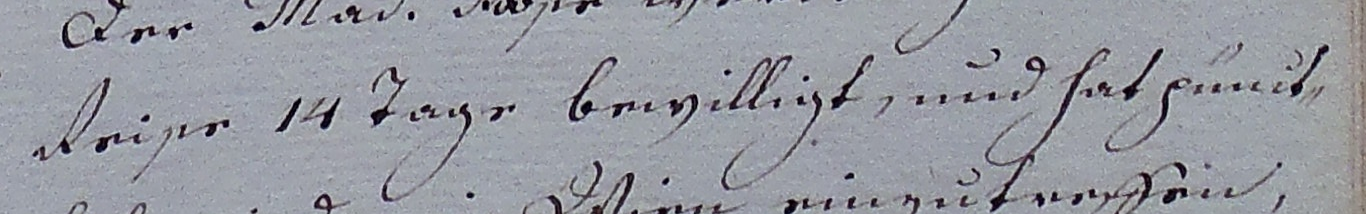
Reise 14 Tage bewilligt, und hat pünct¬
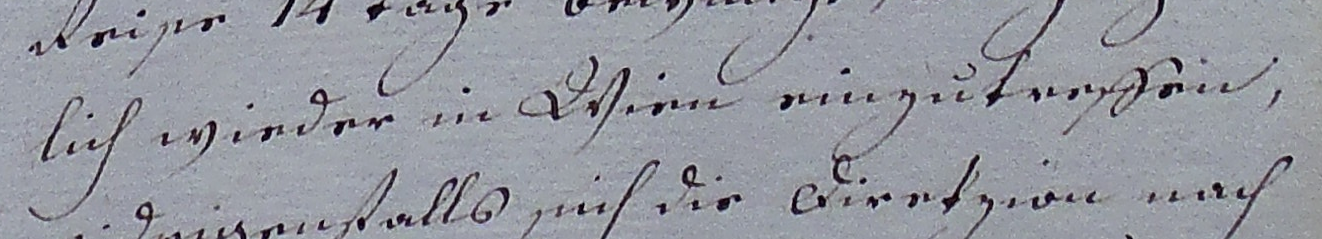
lich wieder in Wien einzutreffen,
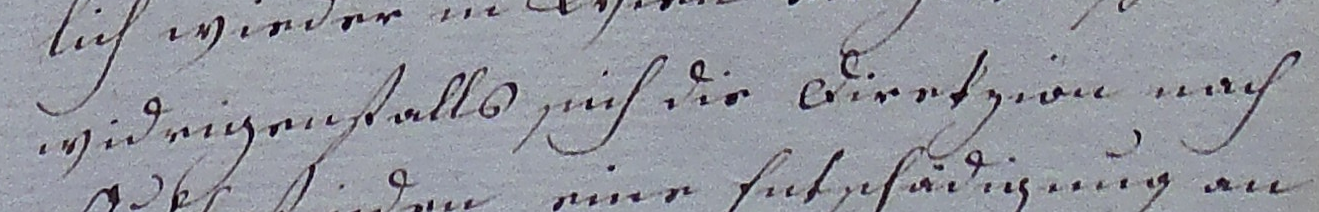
widrigenfalls sich die Direkzion nach
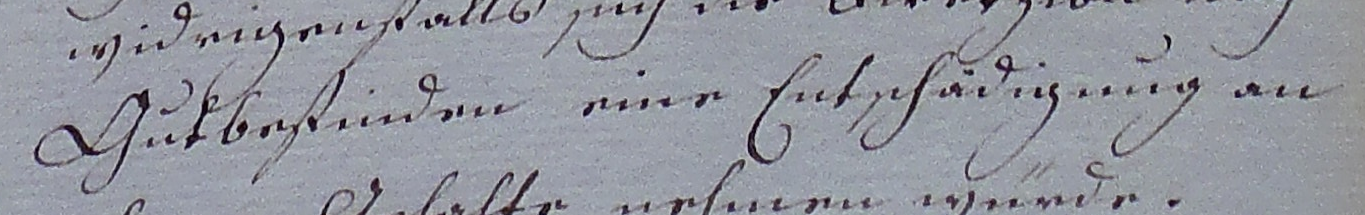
Gutbefinden eine Entschädigung an
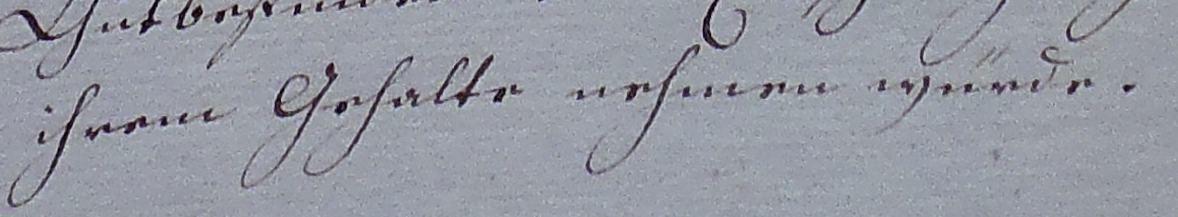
ihrem Gehalte nehmen würde.
